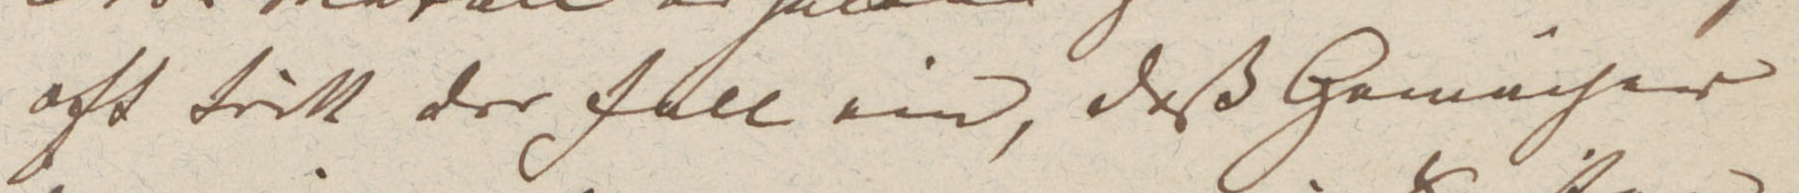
oft tritt der Fall ein, dass Gemächer
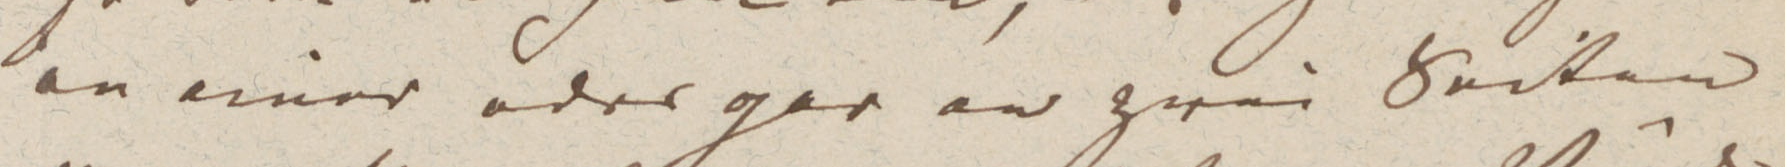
an einer oder gar an zwei Seiten
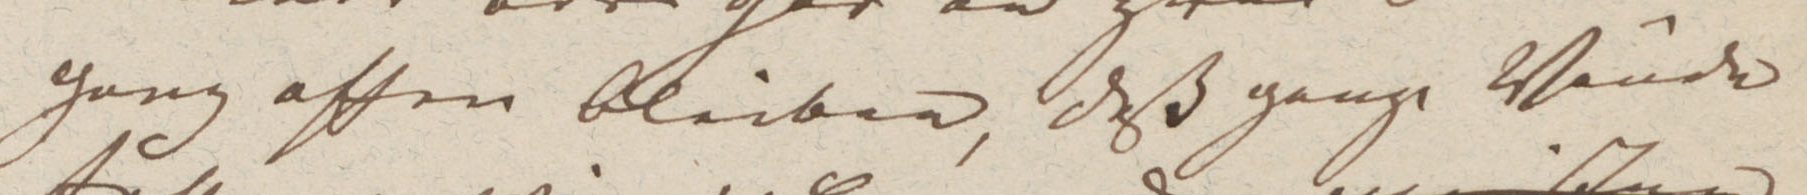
ganz offen bleiben, dass ganze Wände
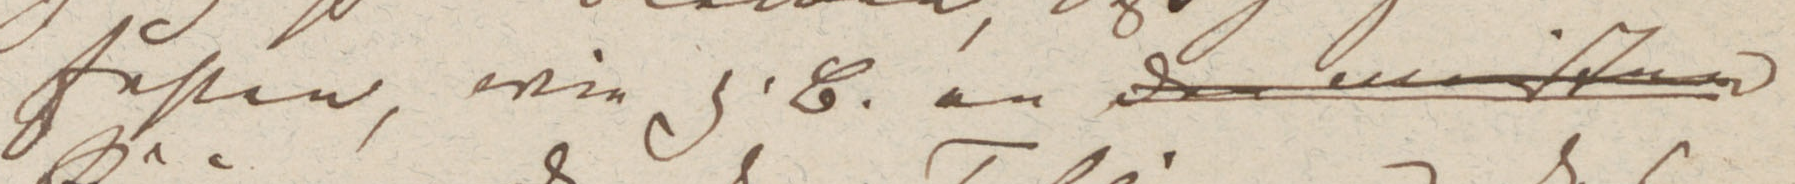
fehlen, wie z.B. an den meisten
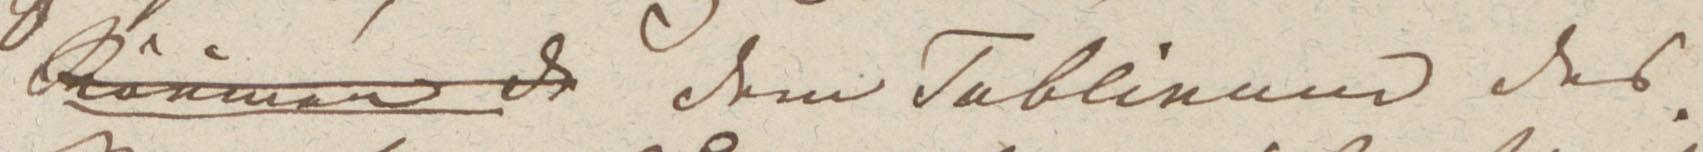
Räumen d dem Tablinum des
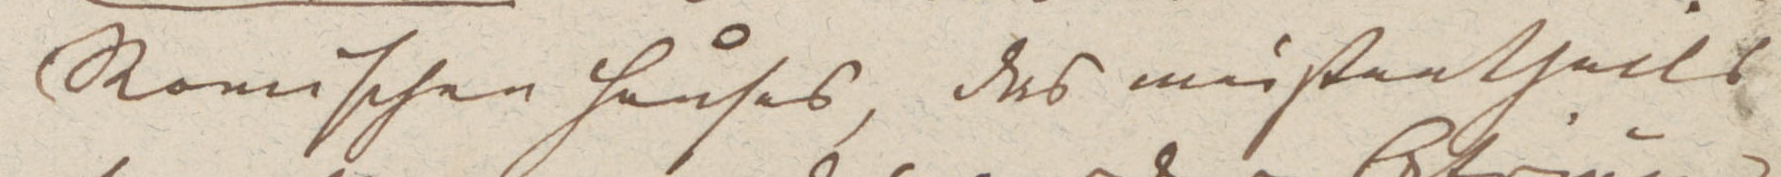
Romischen Hauses, das meistentheils
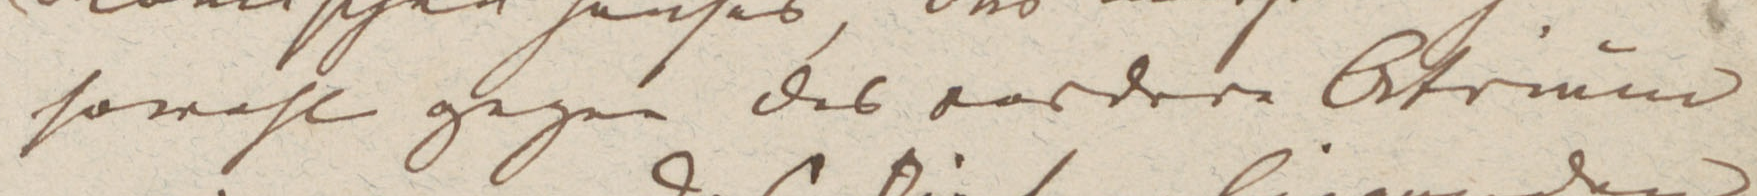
sowohl gegen das vordere Atrium
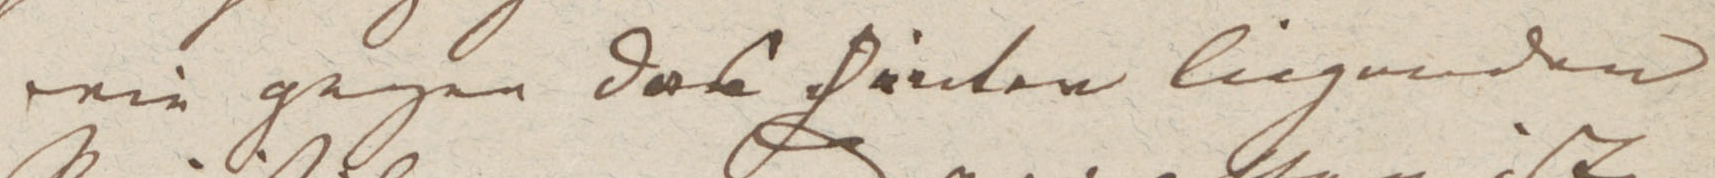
wie gegen das hinten liegenden
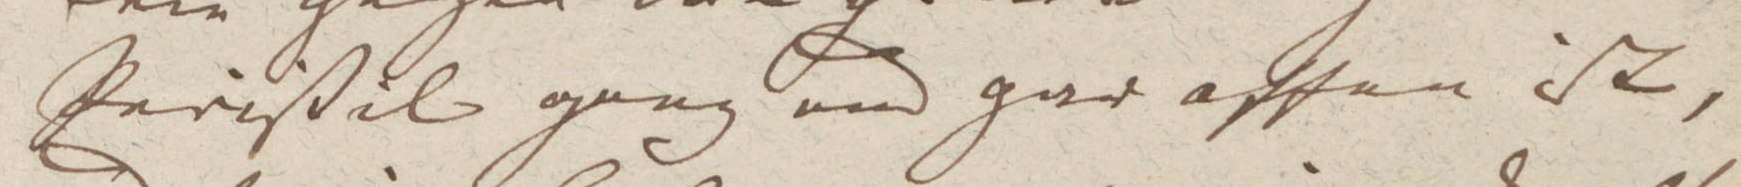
Peristil ganz und gar offen ist,
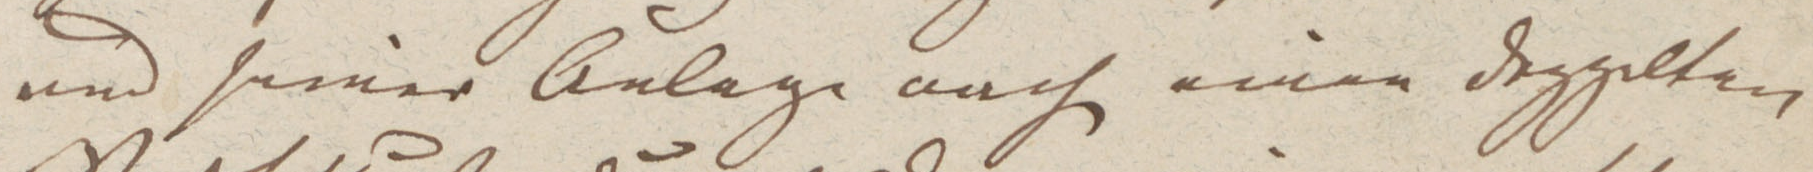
und seiner Anlage nach einen doppelten
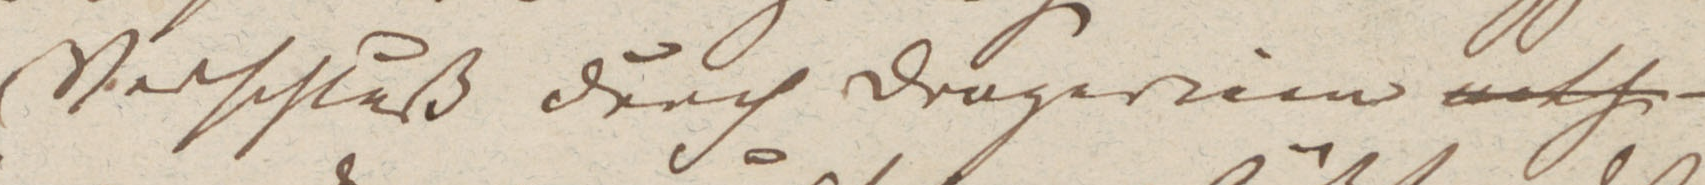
Verschluss durch Draperieen noth-
